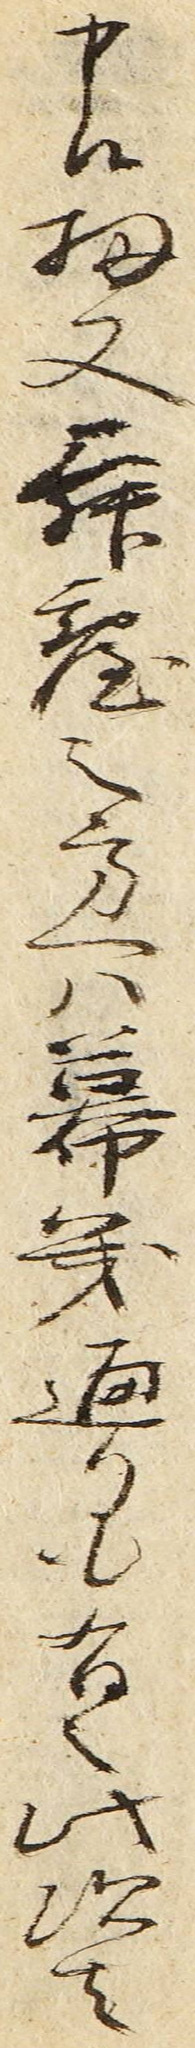申候扨又舞台之方へは幕幾通りも有之此次は
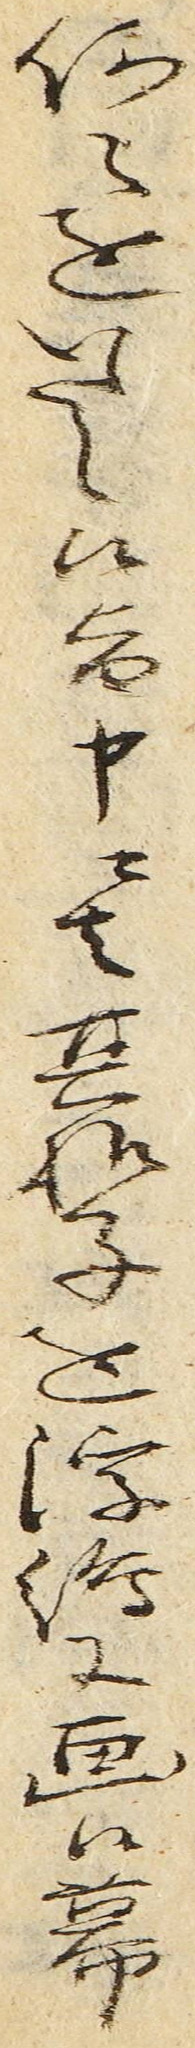何にをいたし候旨申には其様子を浮絵に画候幕

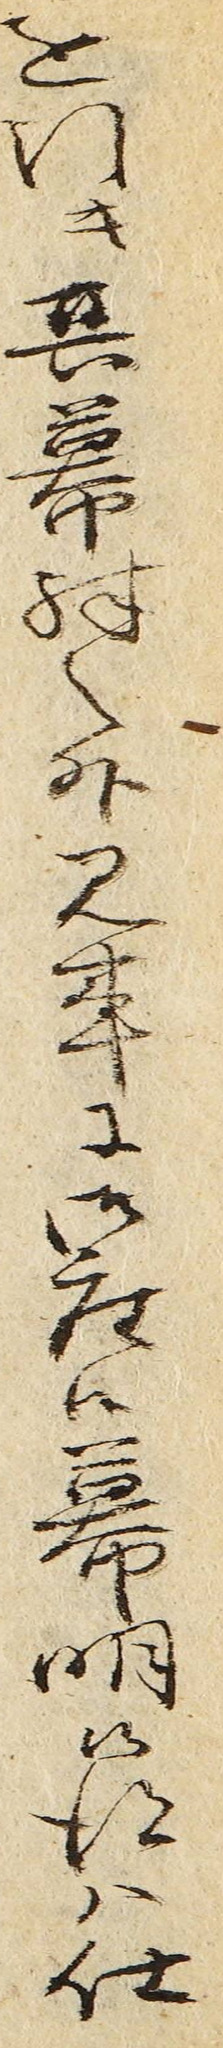を引キ其幕殊之外見事に御座候幕明候得は仕
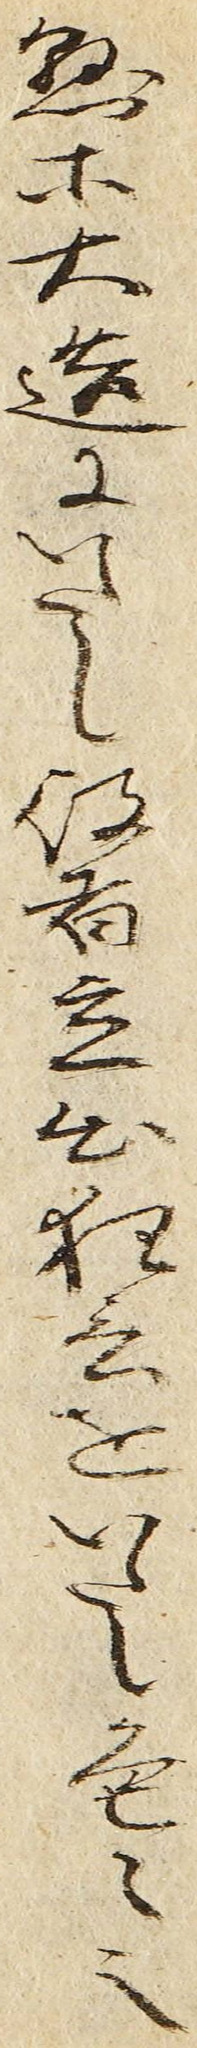懸等大造にいたし役者立出狂言をいたし色々之
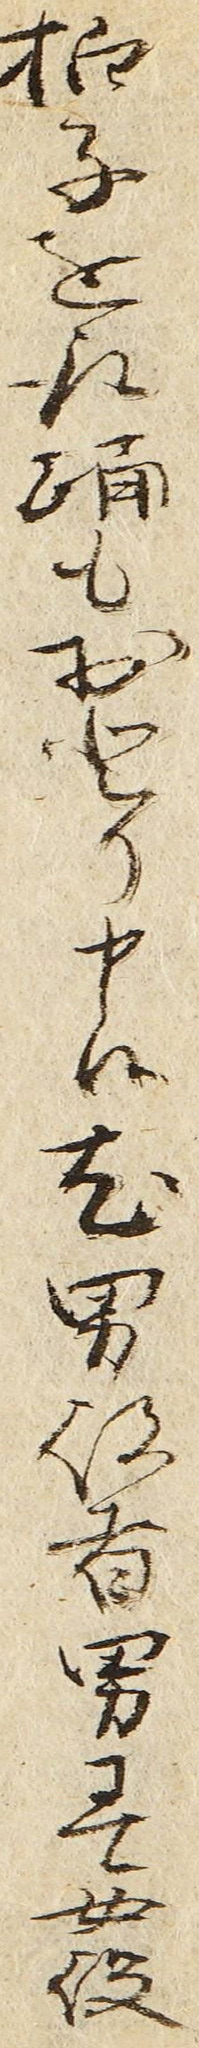拍子を取踊もおとり申候尤男役者男にて女役
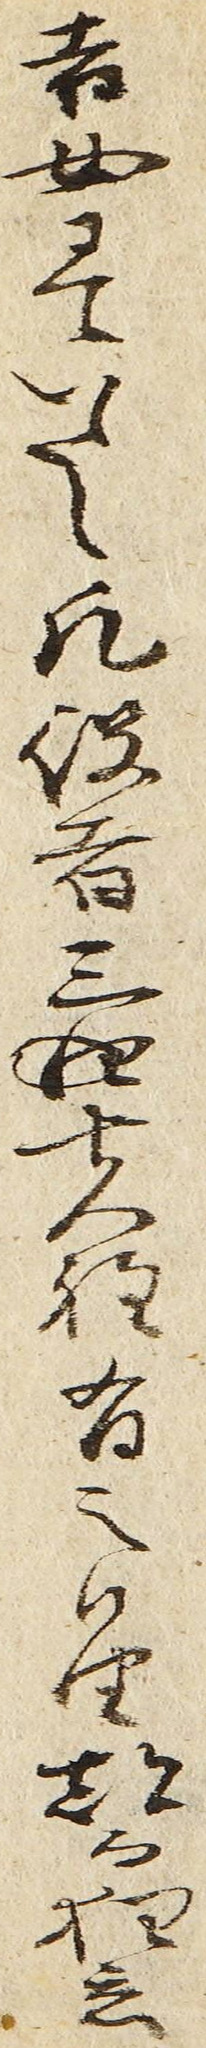者女にていたし凡役者三四十人程有之候由都て狂言
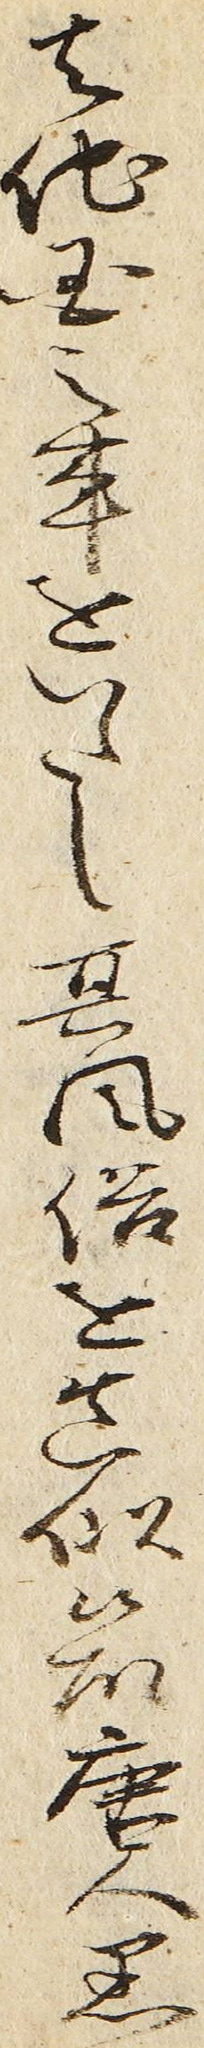は他国之事をいたし其風俗を真似候故唐人黒
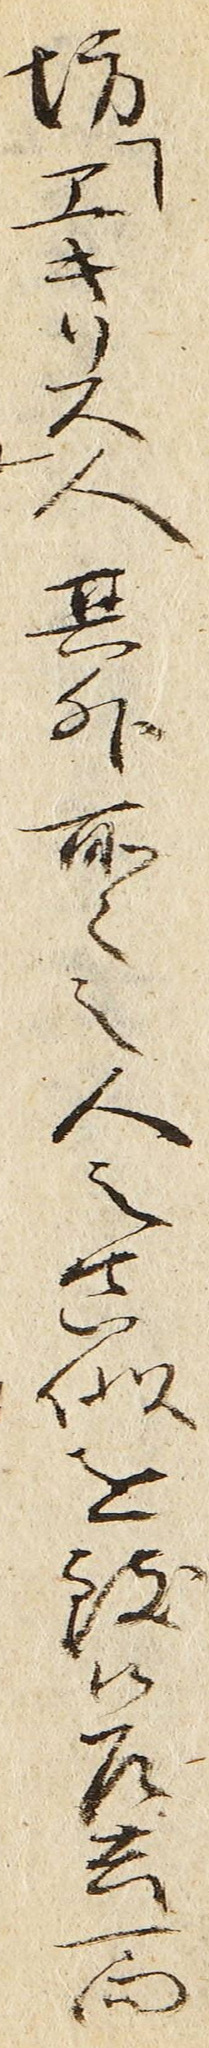坊「ヱキリス」人其外所々之人之真似を致候乍去一向
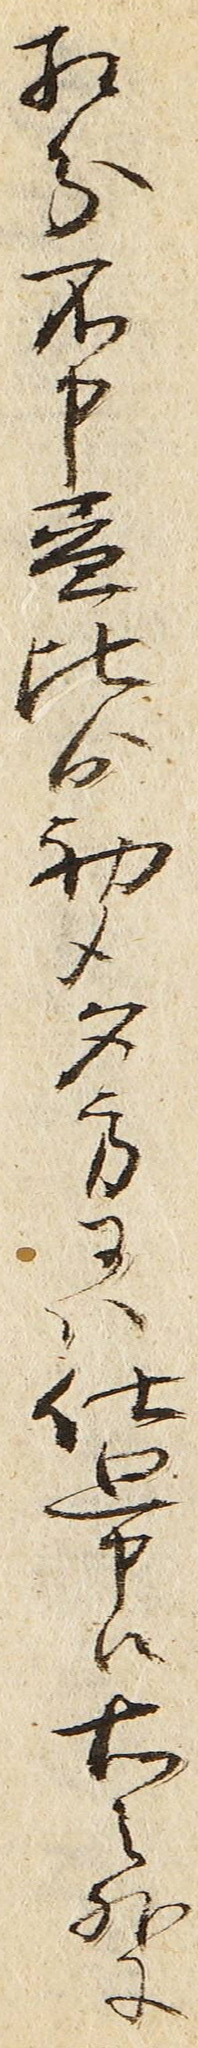相分不申昼比ゟ初メ夕方には仕廻申候右之外に
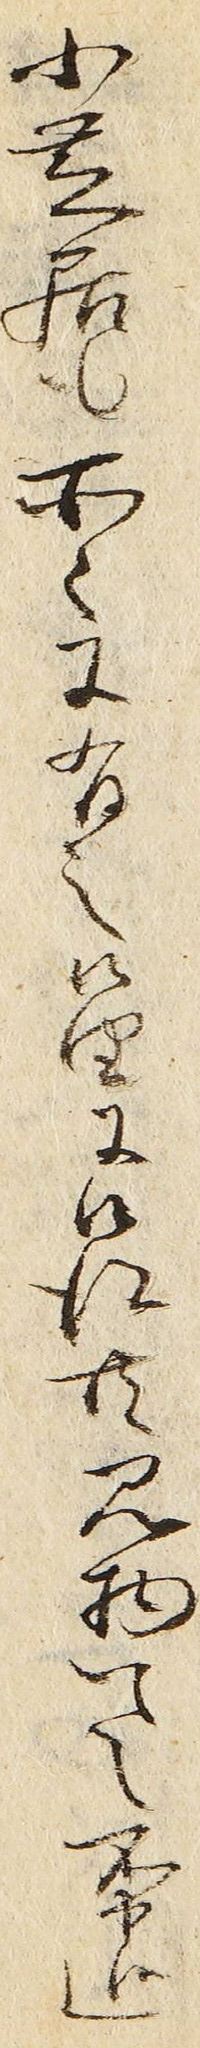小芝居も所々に有之候由に候得共見物いたし不申候」
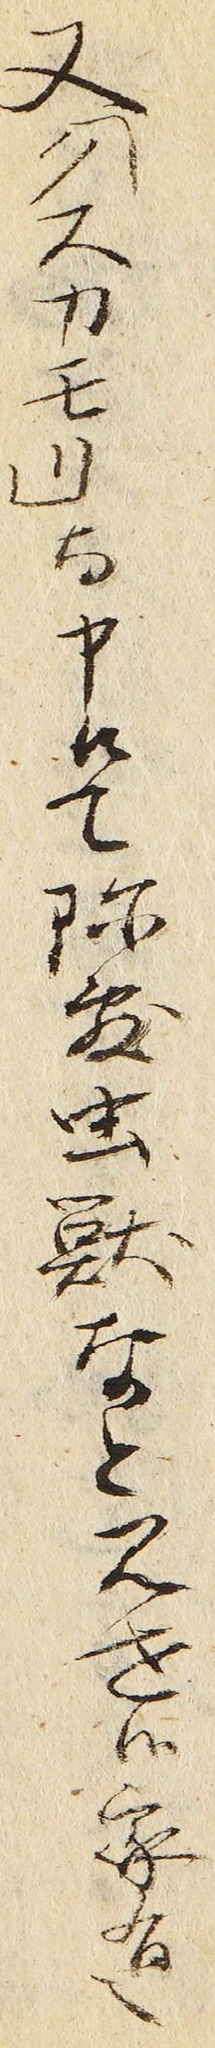又「クスカモリ」と申候て珍敷虫獸なと見せ候家有之
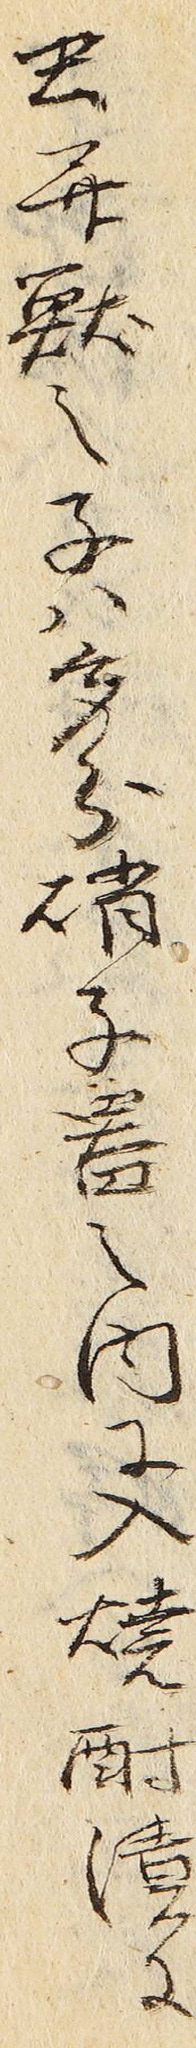虫并獸之子は多分硝子器之内に入焼酎漬ヶに
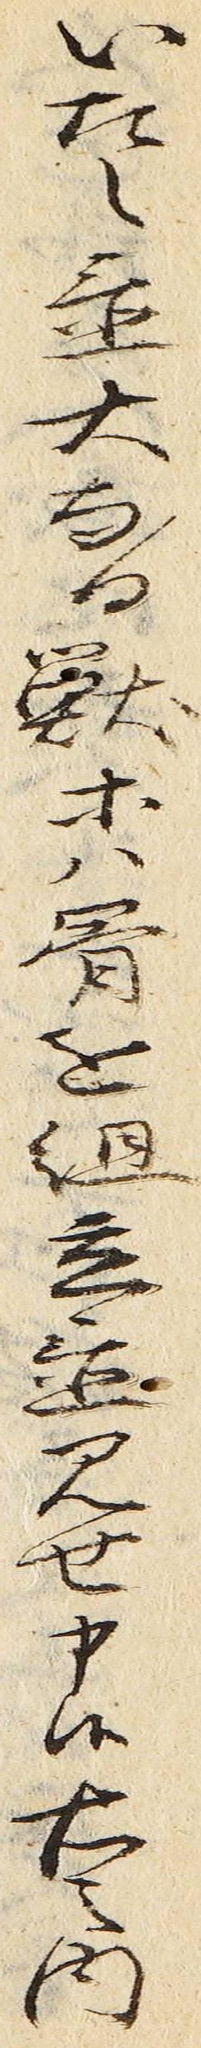いたし置大なる獸等は骨を組立置見せ申候右之内
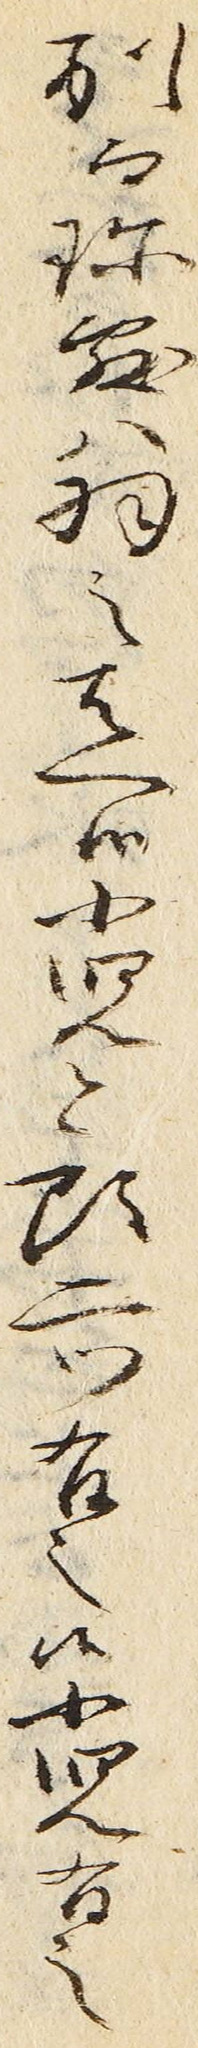別て珍敷は羽之はへ候小児と頭二ツ有之候小児有之
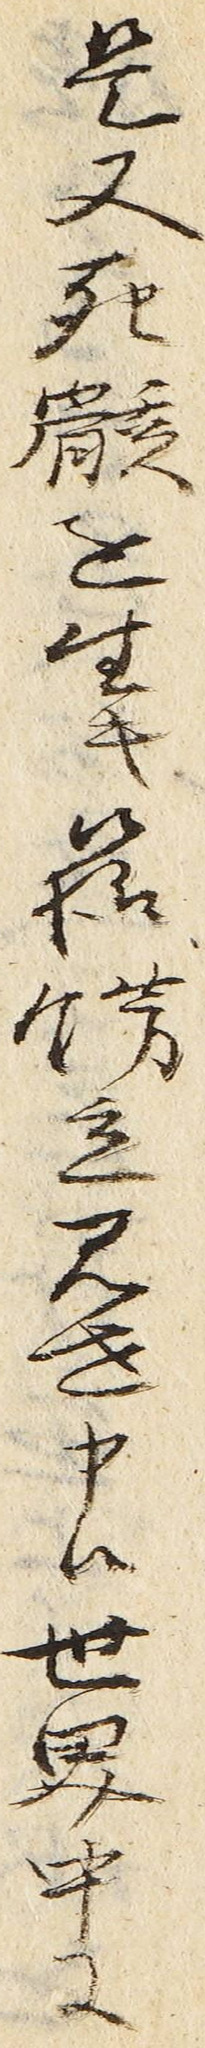是又死骸を生キ候様餝立見せ申候世界中に
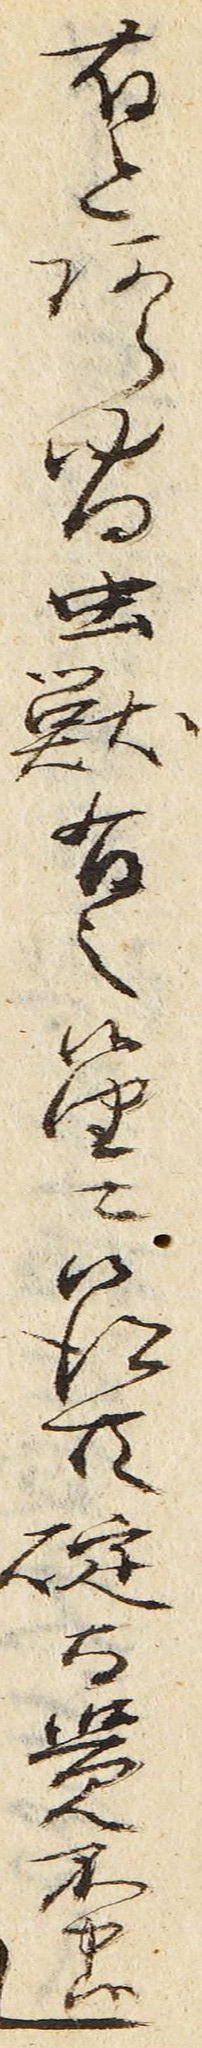有とあらゆる虫獸有之候由に候得共碇と覚不申候」
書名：漂民後記
